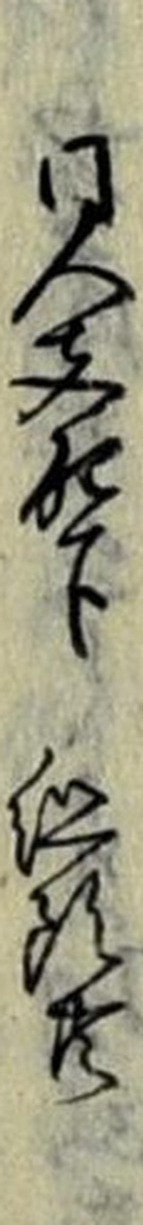同人支配下組頭共
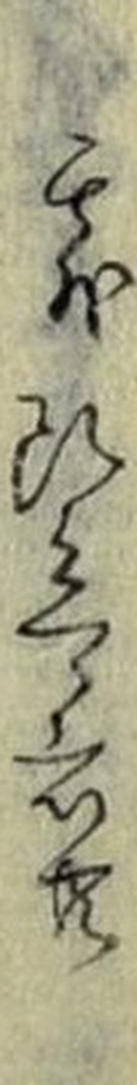其外頭立候者共
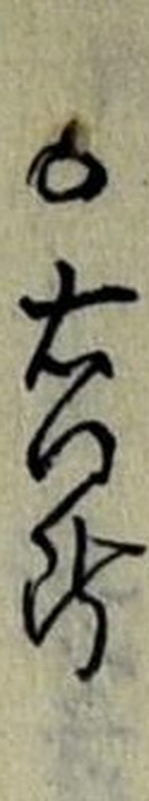〇右同断
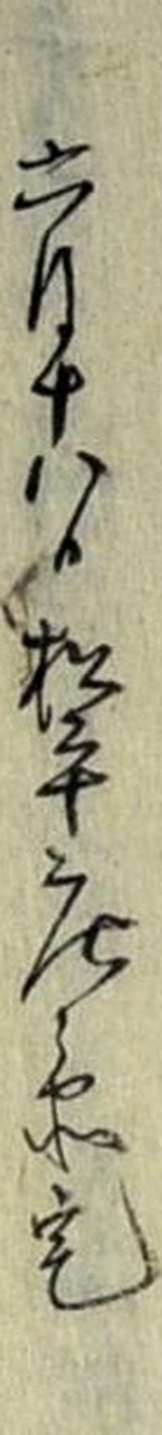六月十八日松平庄兵衛宅
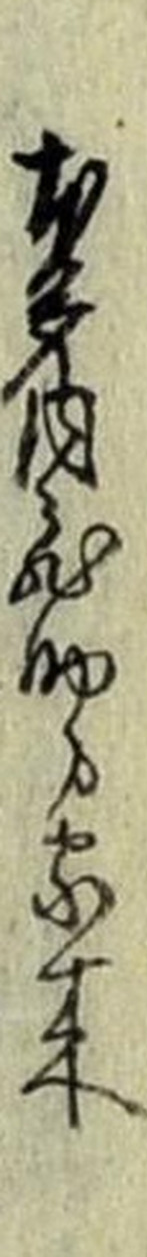本多内蔵助方家来
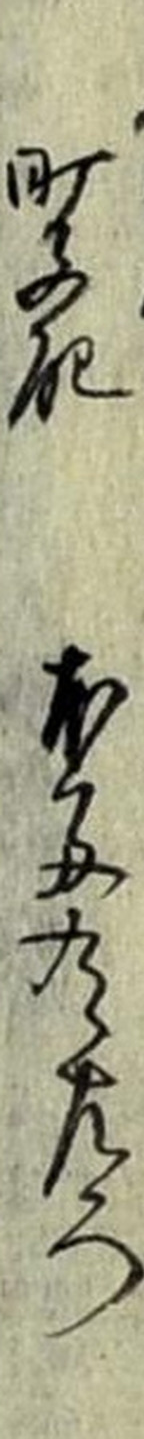町支配本多九郎左衛門
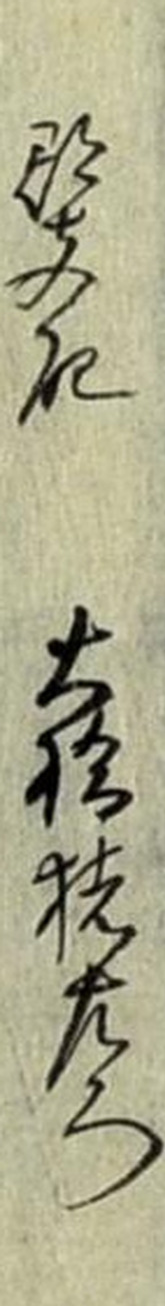郡支配大橋猪左衛門
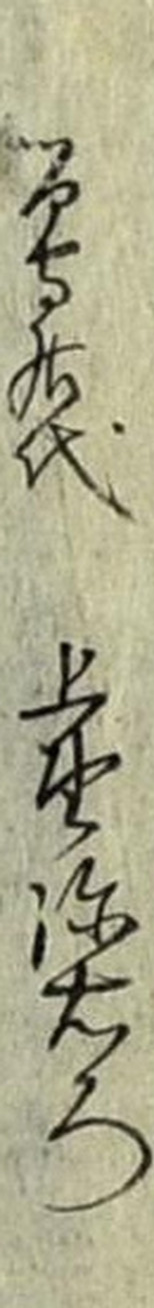留守居代上野弥右衛門
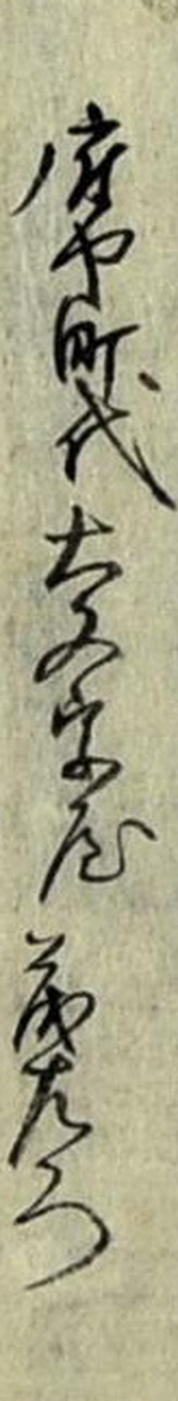府中町代大文字屋茂左衛門
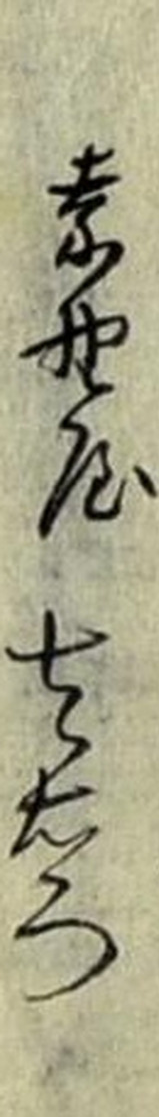桑野屋七郎右衛門
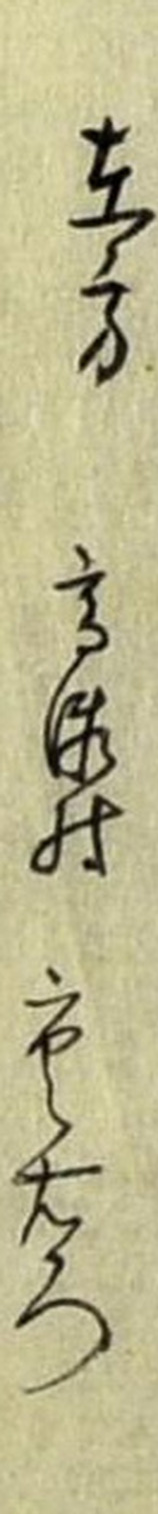在方高瀬村市郎右衛門
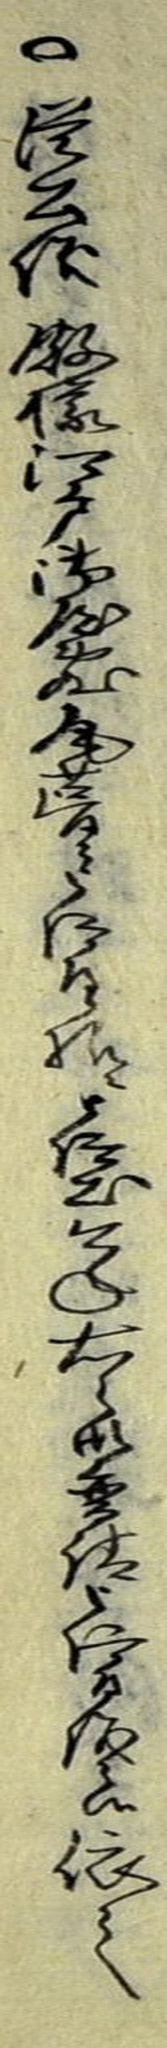〇従公儀殿様江戸御屋敷瓦葺ニ被仰付候様ニ被仰出今年右之御普請被仰付儀ニ候依之

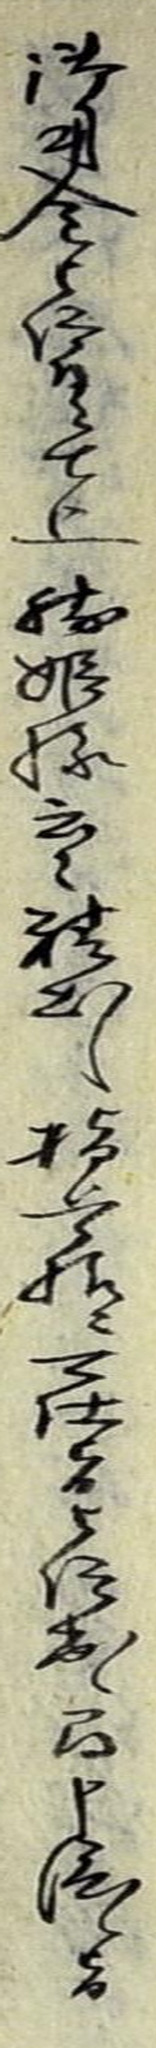御用金被仰付候其上勝姫様云々精出し指上候様ニ可仕旨被仰出候間申渡候旨
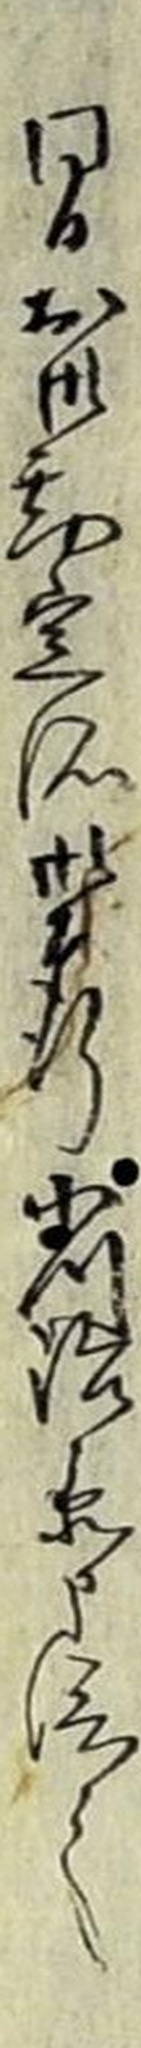同日於御勘定所御奉行小川治兵衛申渡之
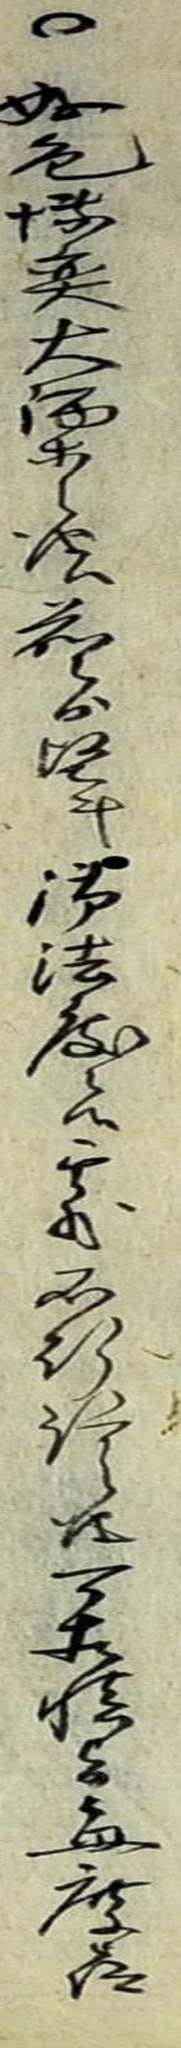〇好色博奕大酒等之儀ハ前々ゟ堅キ御法度ニ候其外不行跡之儀可相慎旨毎度被仰
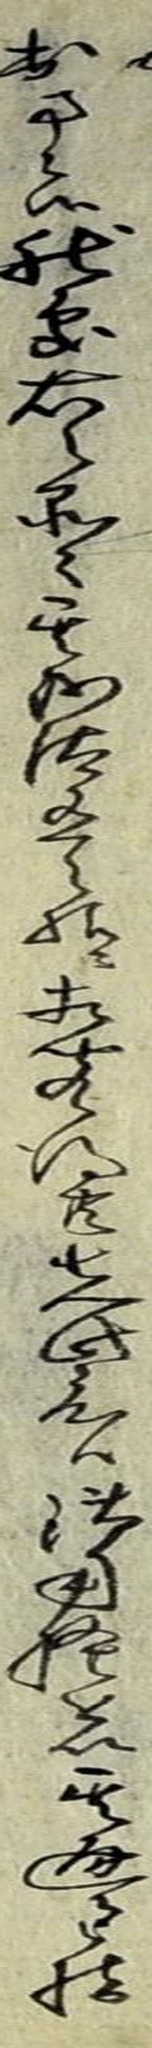出事ニ候然処右之品々其沙汰有之様ニ相聞候得共先此度ハ御用捨を以其通ニ被指
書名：命令之部 一
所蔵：福井県文書館 Fukui Prefectural Archives
